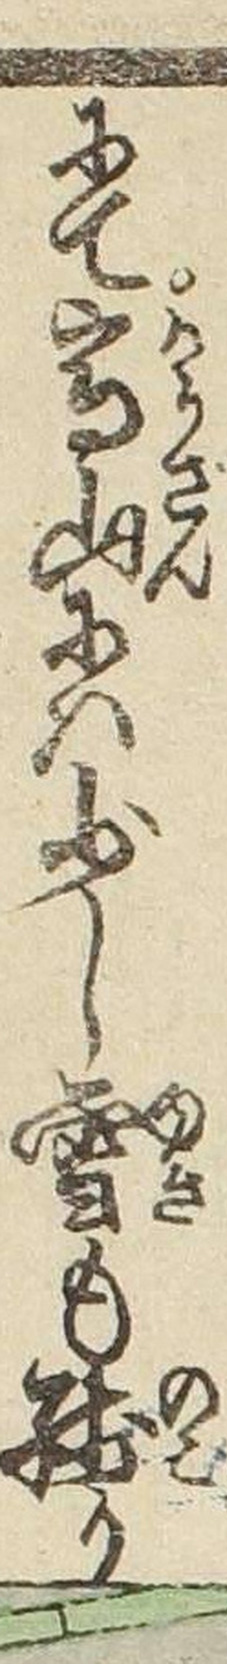にて。高山には少し雪も残り
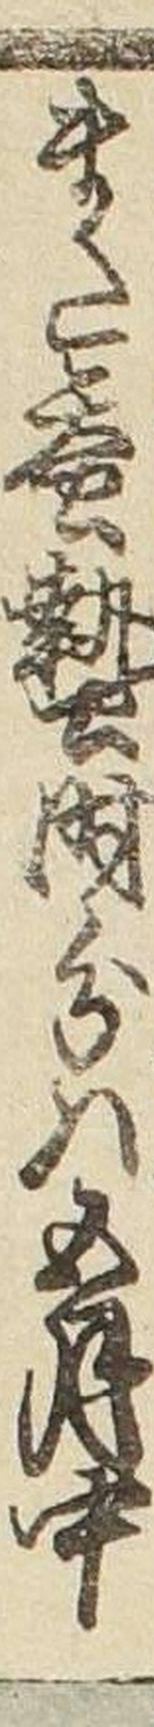また蚕蟄時分は。五月中
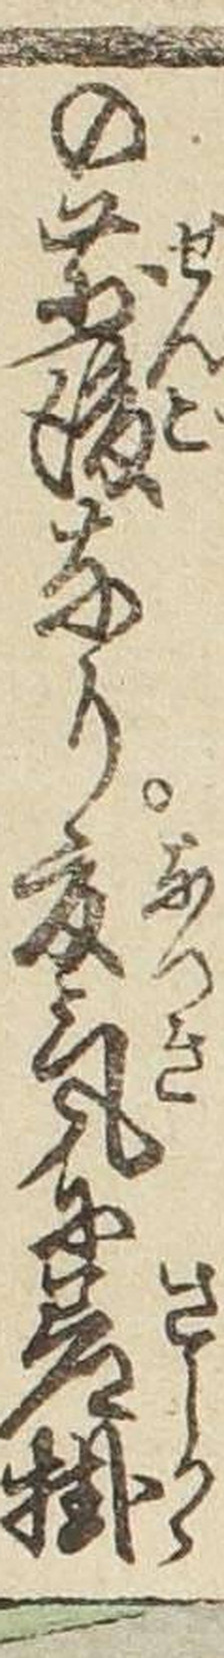の前後なり。夏気に差掛
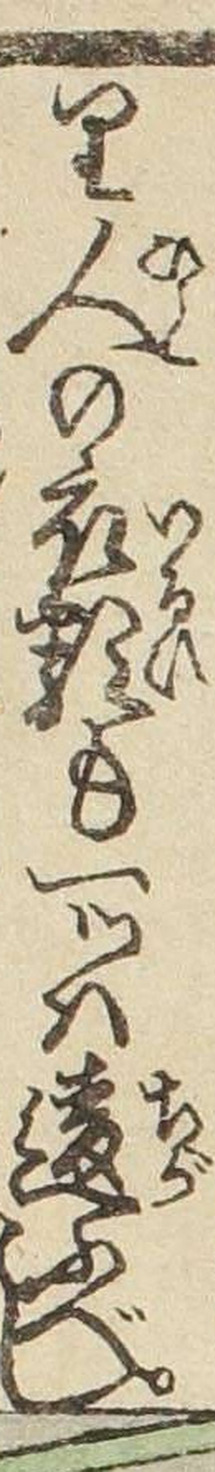り人の衣類も一ッは違ふべし。
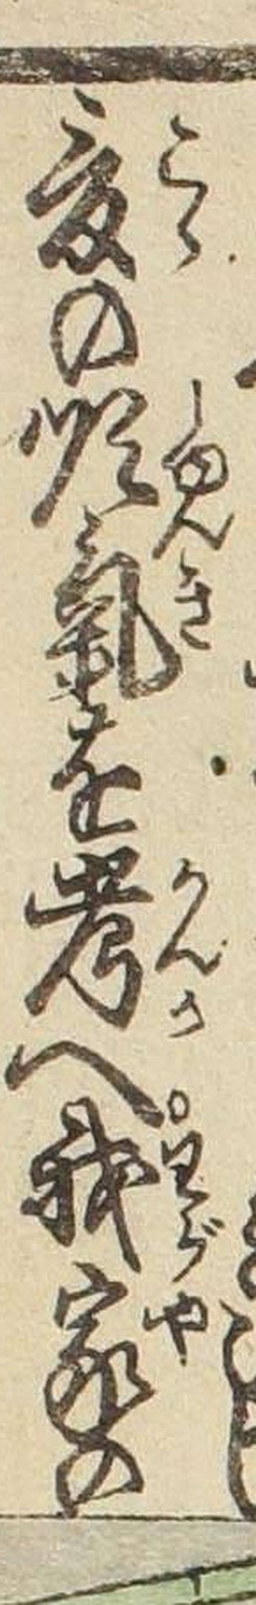爰の順気を考へ。我家の

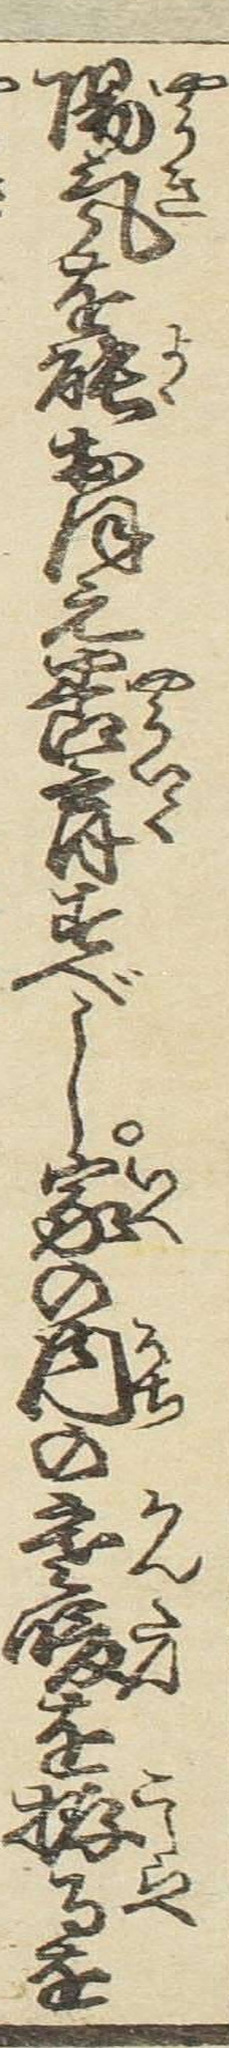陽気を能おほえ養育すべし。家の内の寒暖を拵るを
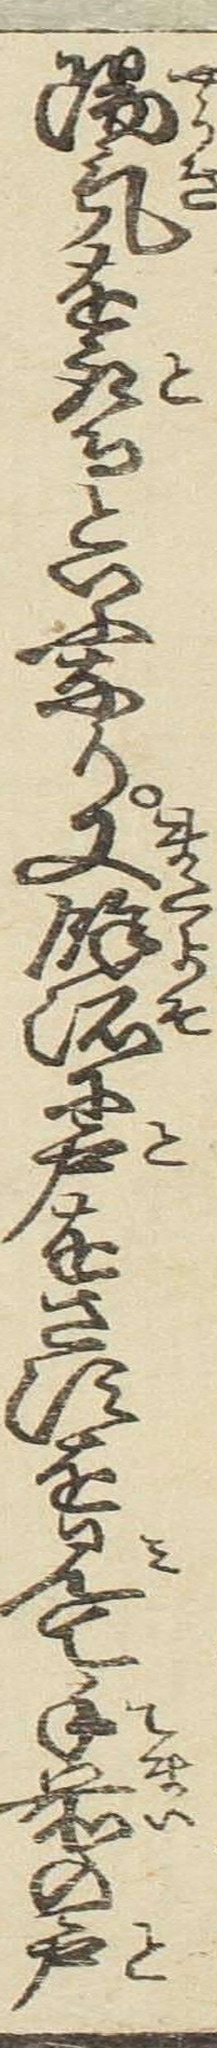陽気を取るといふなり。又余所に戸をさすを見て手前の戸
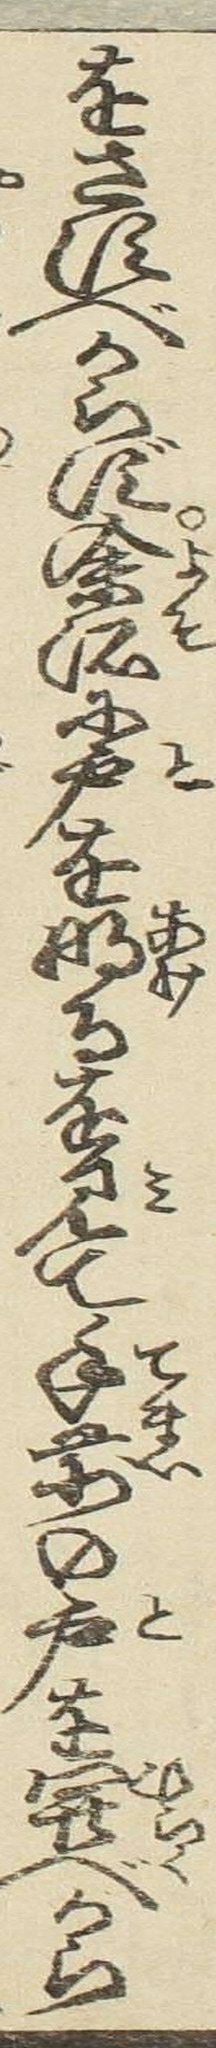をさすべからず。余所に戸を明るを見て手前の戸を開べから
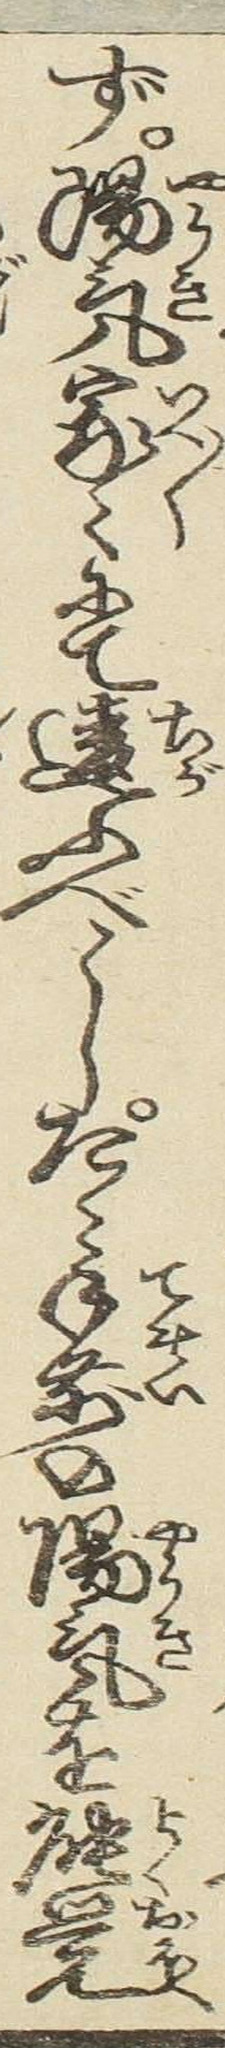ず。陽気家々にて違ふべし。たゝ手前の陽気を能覚
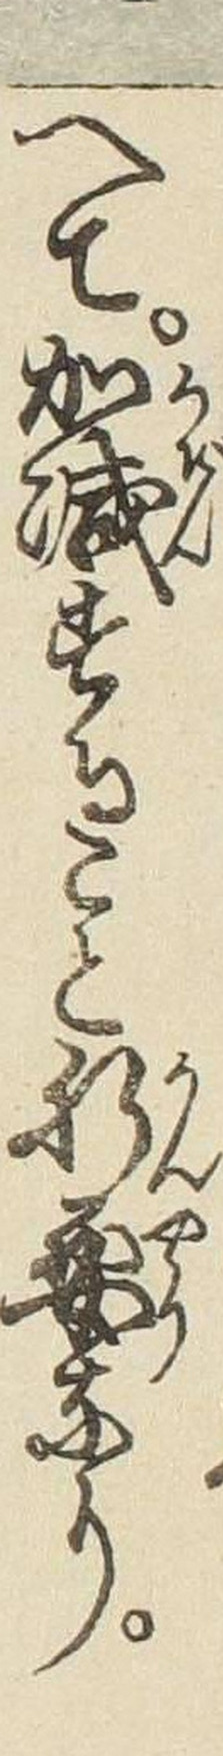へて。加減すること肝要なり。
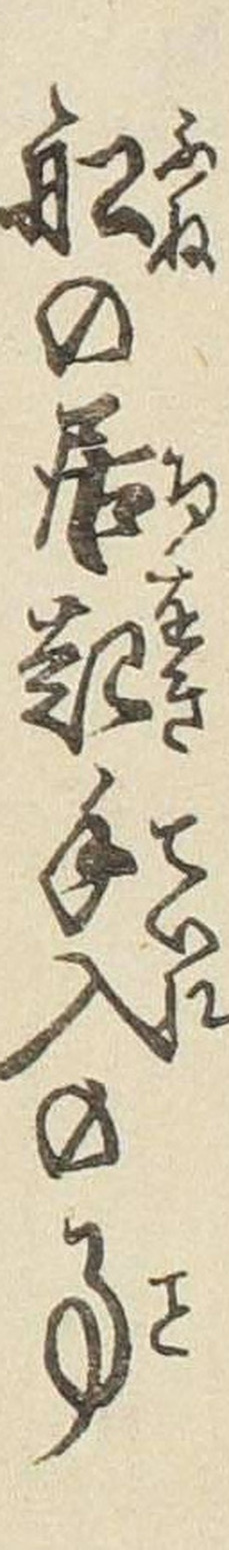船の居起手入の事
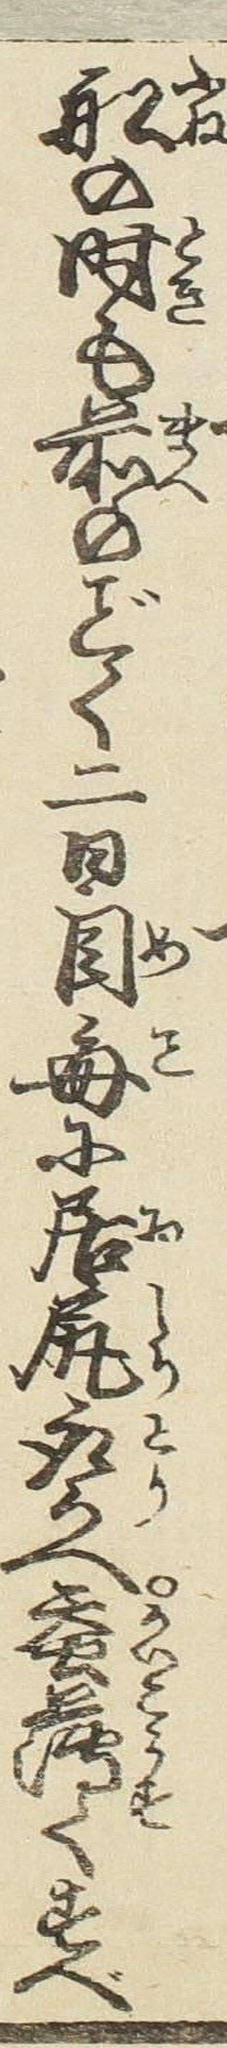船の時も前のごとく二日目毎に居尻取かへ。蚕薄くすべ
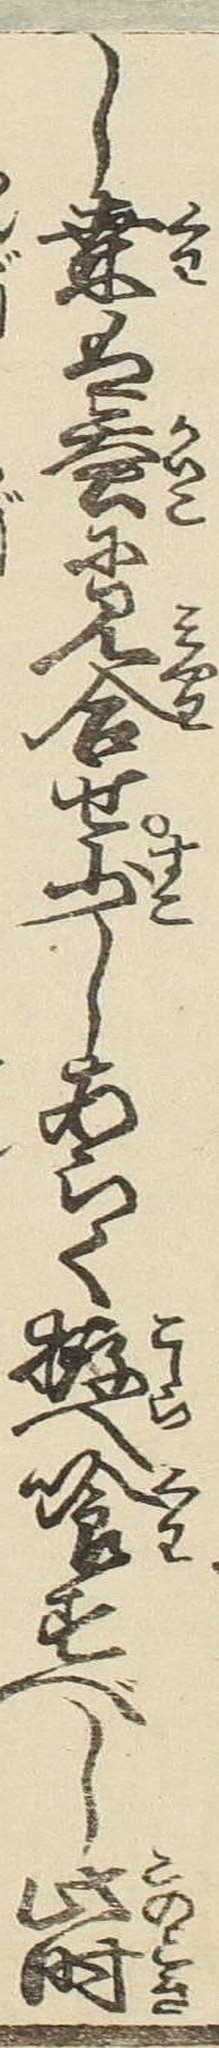し桑は蚕に見合せ。少しあらく拵へ喰すべし。此時
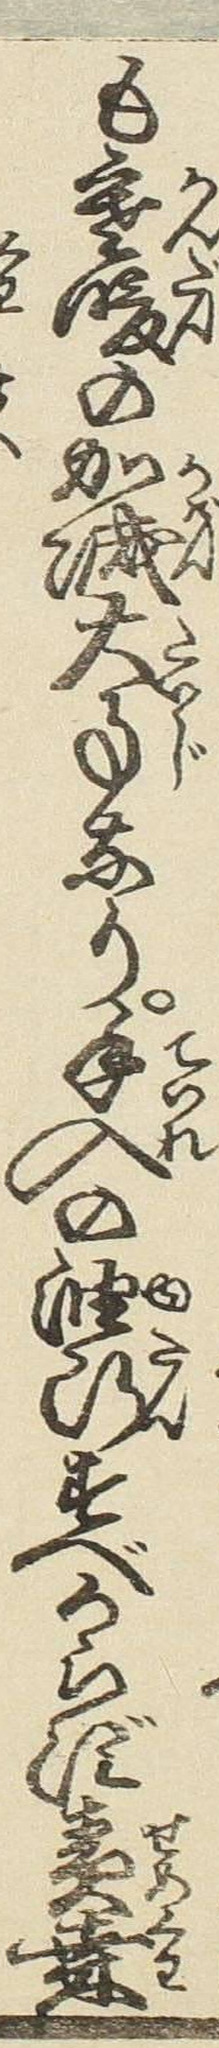も寒暖の加減大事なり。手入の油断すべからず責桑
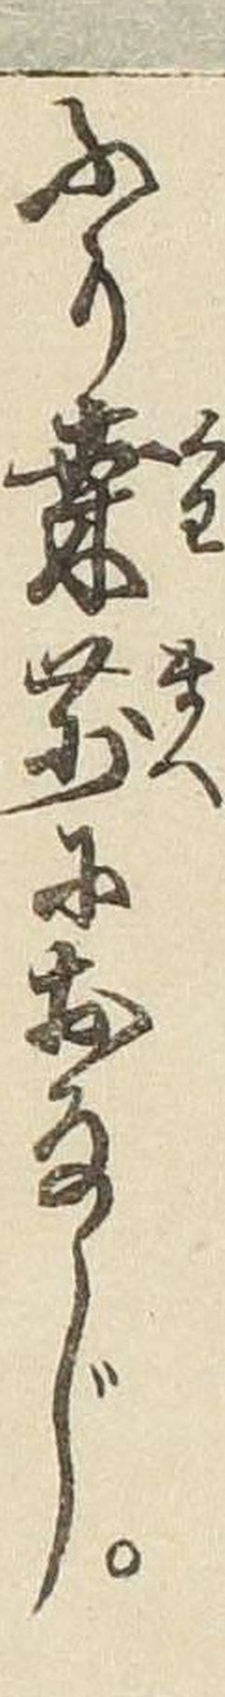ふり桑前におなじ。
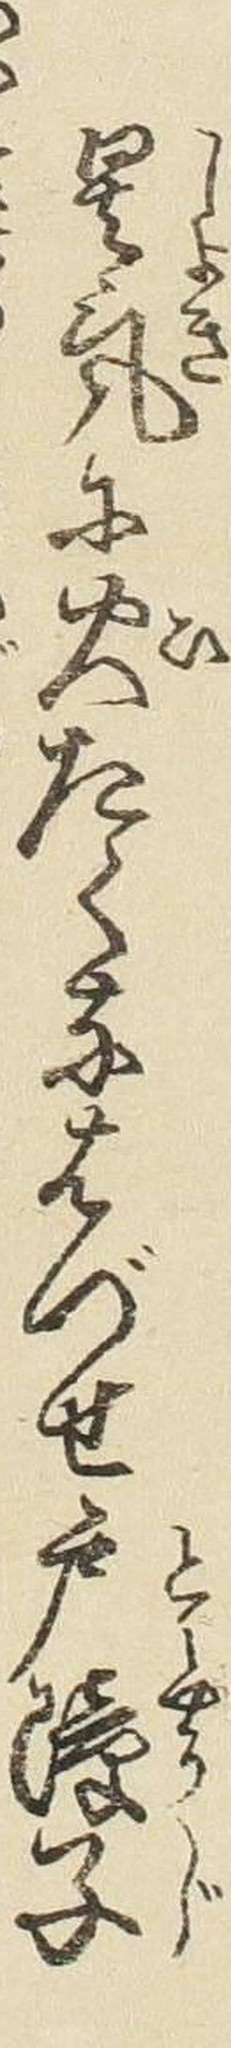暑気に火たくなはづせ戸障子
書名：養蠶圖解
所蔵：東京大学農学生命科学図書館 国文学研究資料館
